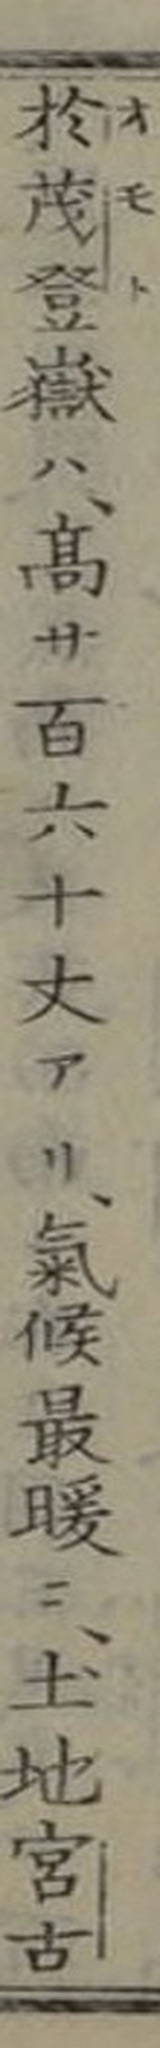於茂登岳ハ、高サ百六十丈アリ、気候最暖ニ、土地宮古
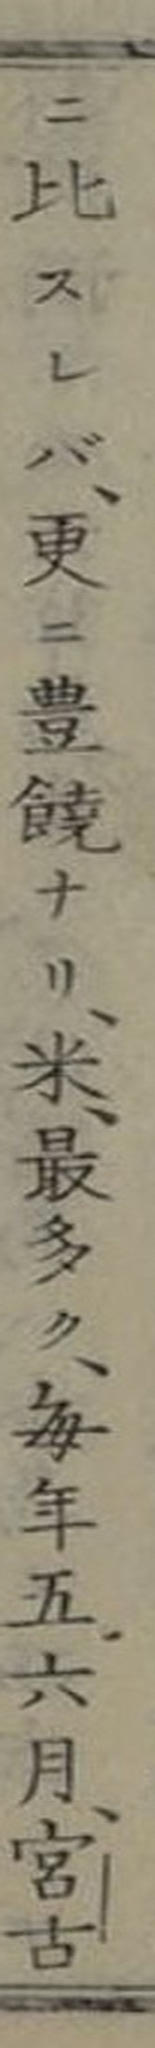ニ比スレバ、更ニ豊饒ナリ、米、最多ク、毎年五六月、宮古
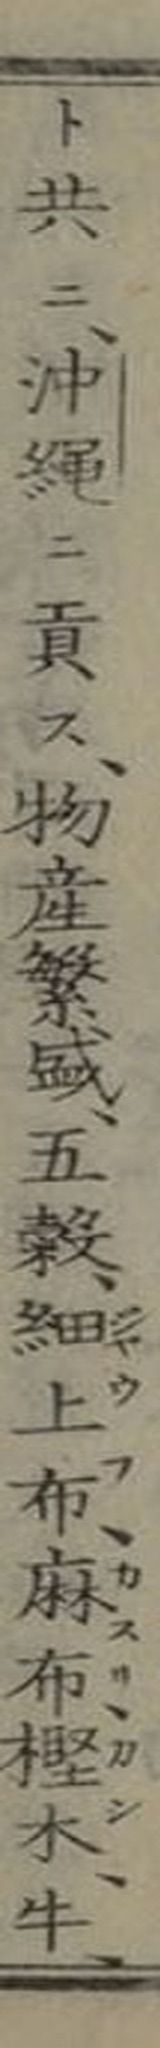ト共ニ、沖縄ニ貢ス、物産繁盛、五穀、細上布、麻布、樫木、牛、

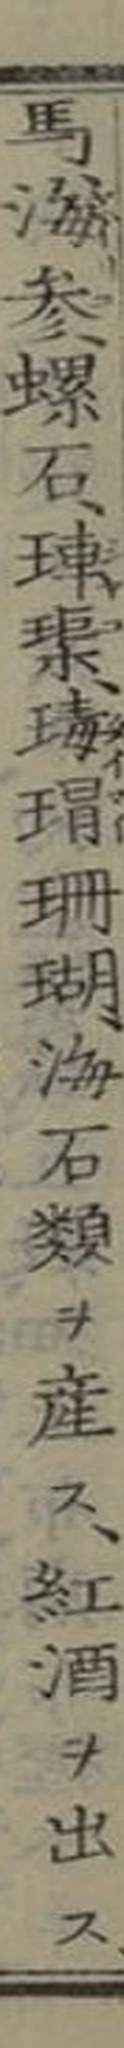馬、海参、螺石、、瑇瑁珊瑚、海石類ヲ産ス、紅酒ヲ出ス、
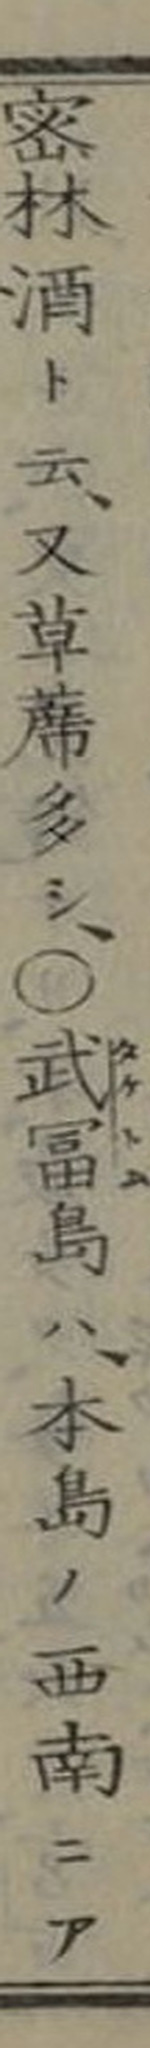密林酒ト云、又草蓆多シ、○武富島ハ、本島ノ西南ニア
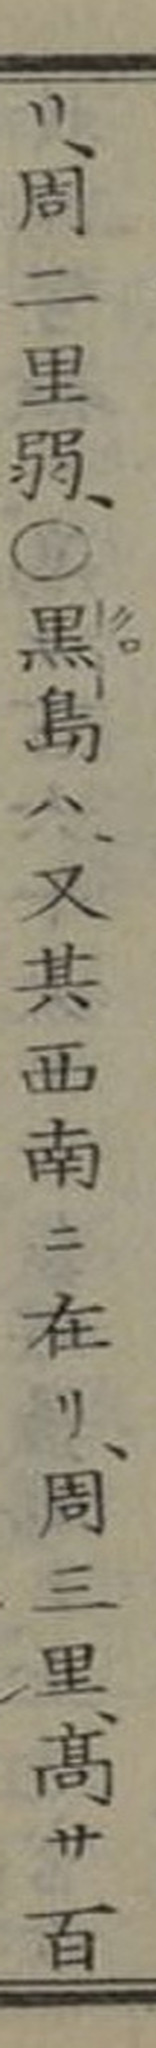リ、周二里弱、○黒島ハ、又其西南ニ在リ、周三里、高サ百
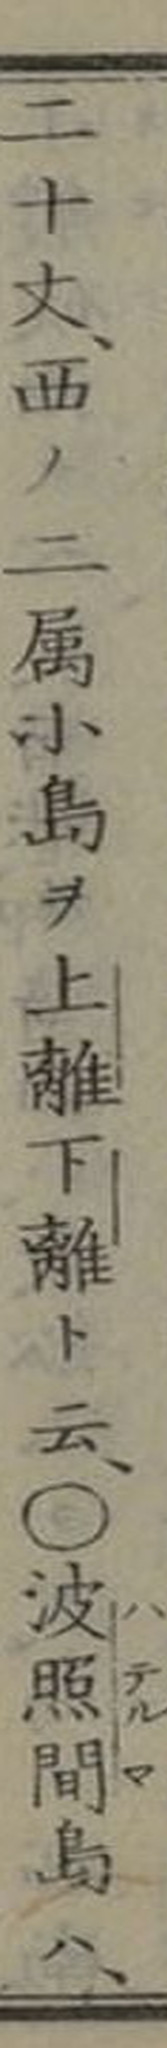二十丈、西ノ二属小島ヲ上離下離ト云、○波照間島ハ、
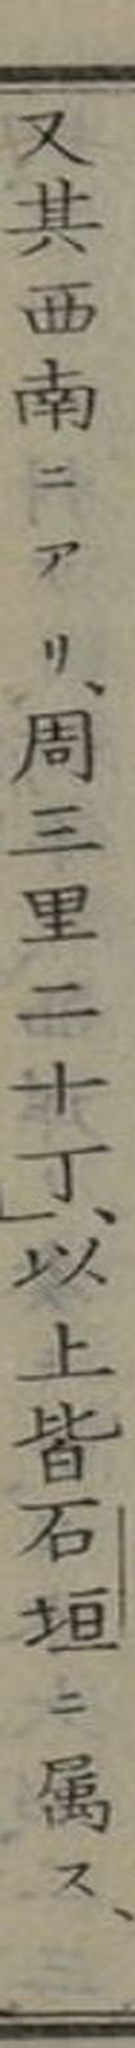又其西南ニアリ、周三里二十丁、」以上皆石垣ニ属ス、
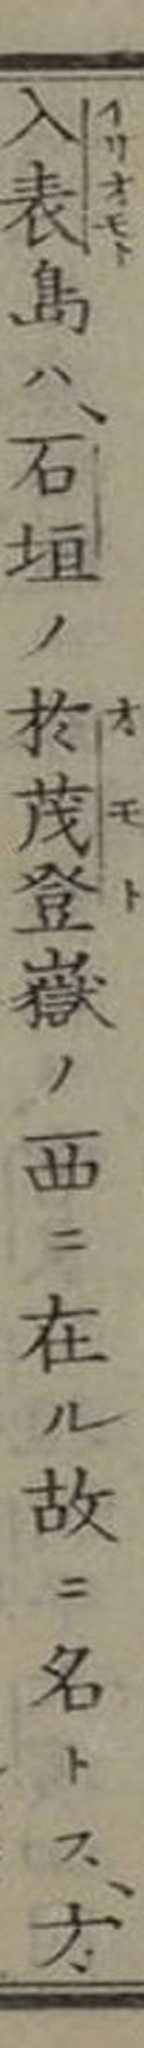入表島ハ、石垣ノ於茂登岳ノ西ニ在ル故ニ名トス、方
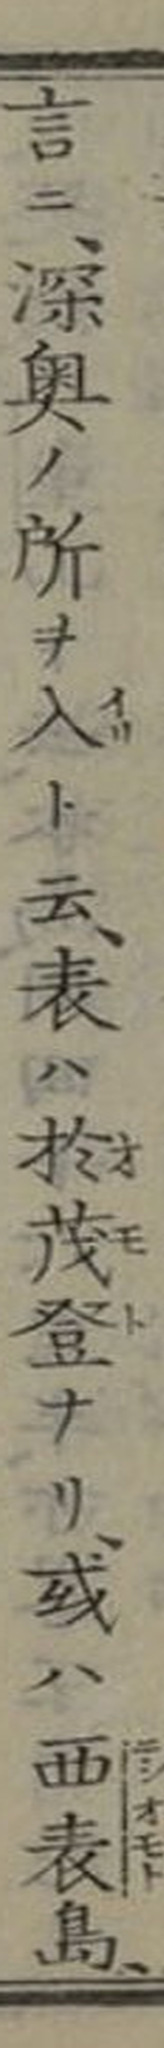言ニ、深奥ノ所ヲ入ト云、表ハ於茂登ナリ、或ハ西表島、
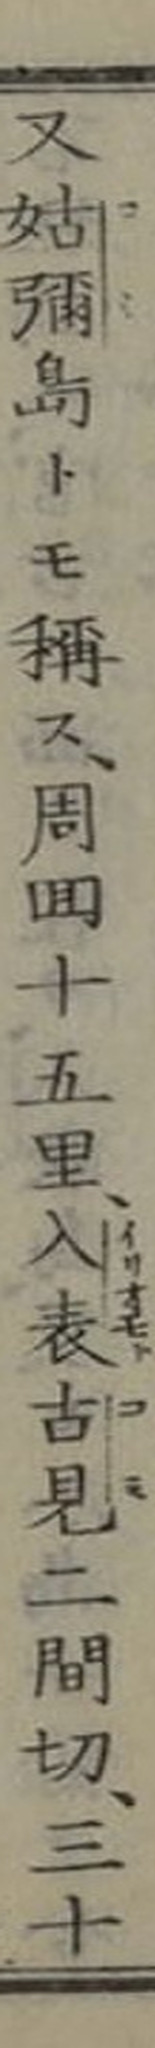又姑弥島トモ称ス、周囲十五里、入表古見二間切、三十
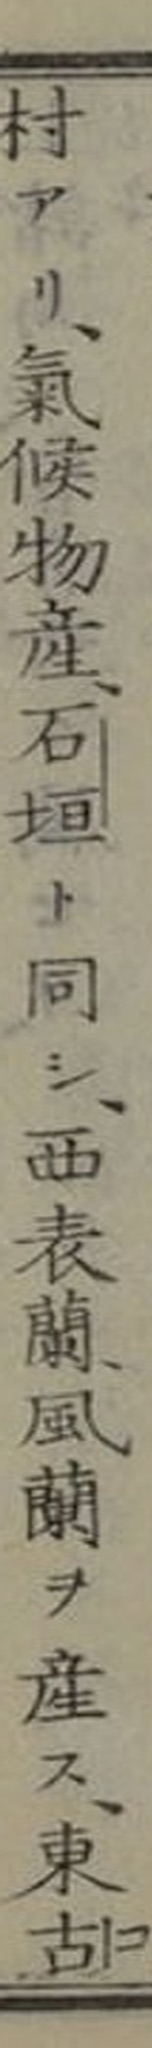村アリ、気候物産、石垣ト同シ、西表蘭、風蘭ヲ産ス、東古
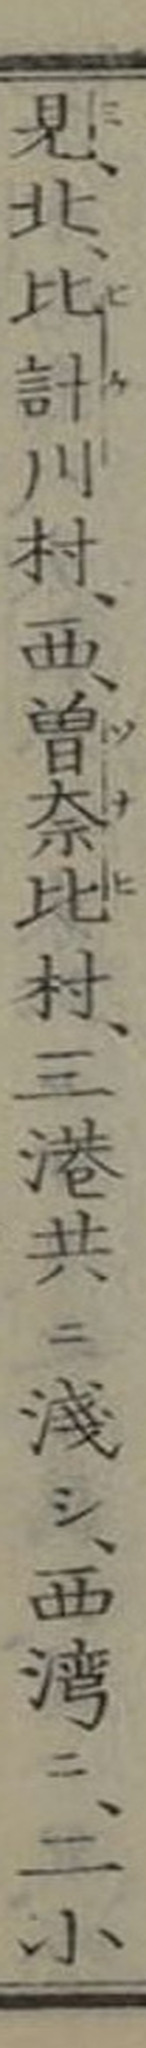見、北、比計川村、西、曽奈比村、三港共ニ浅シ、西湾ニ、二小
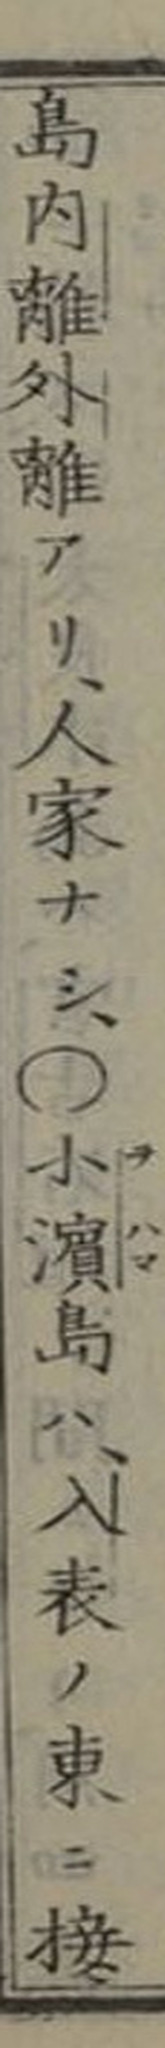島内離外離アリ、人家ナシ、○小浜島ハ、入表ノ東ニ接
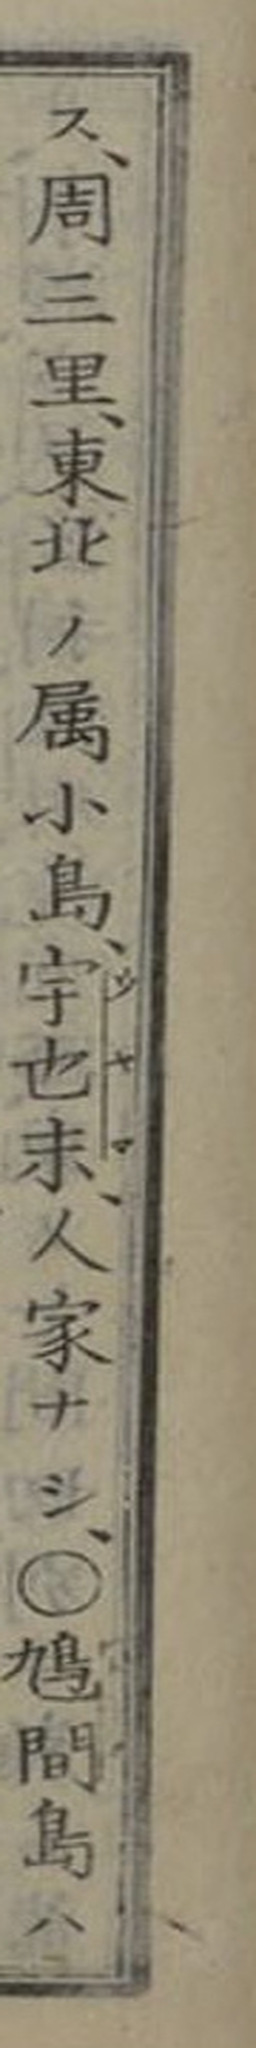ス、周三里、東北ノ属小島、宇也末、人家ナシ、○鳩間島ハ
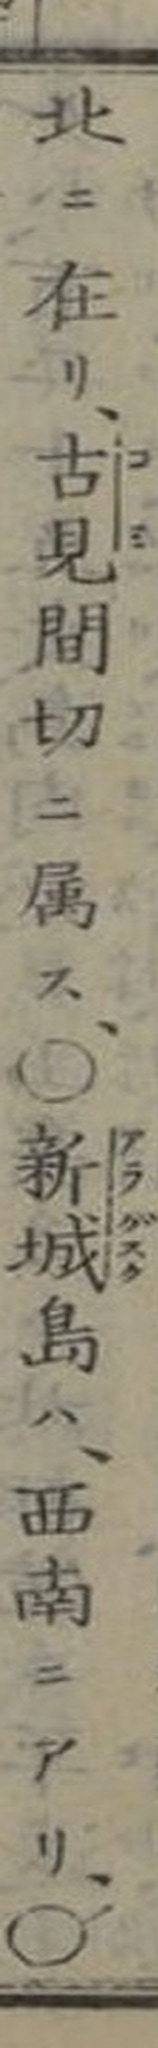北ニ在リ、古見間切ニ属ス、○新城島ハ、西南ニアリ、○
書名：琉球新誌 図附 上
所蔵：University of the Ryukyus Library
